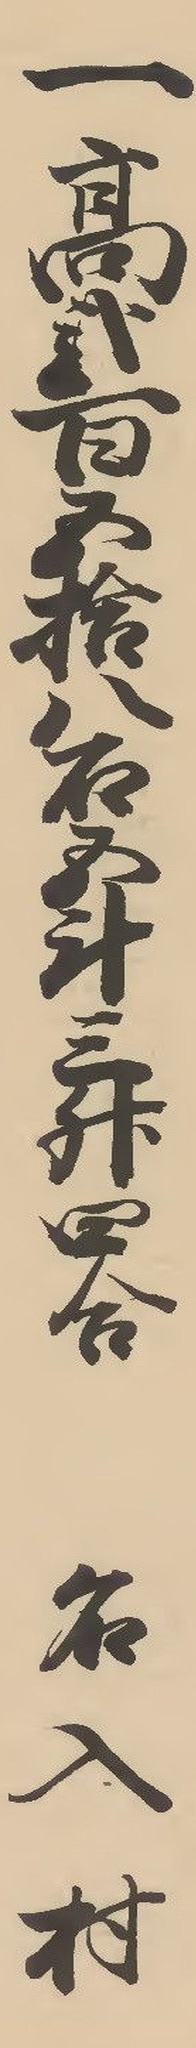一高弐百五拾八石五斗三升四合名入村
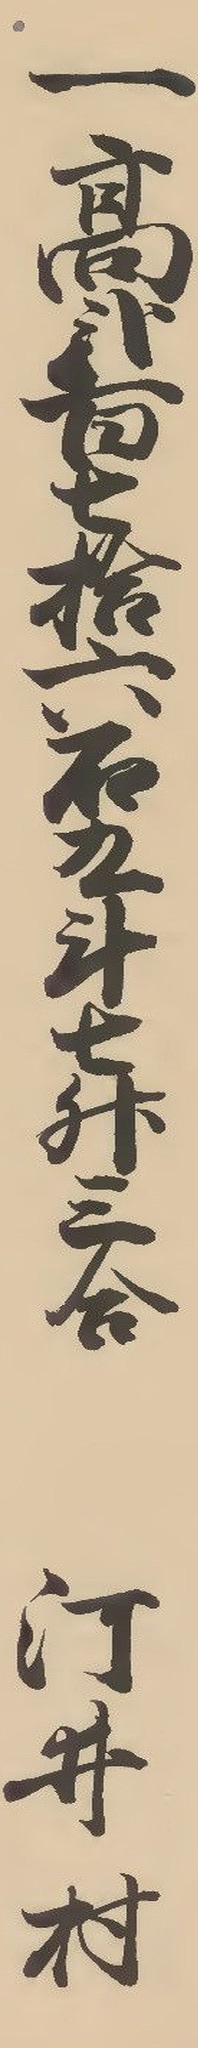一高弐百七拾六石九斗七升三合河井村
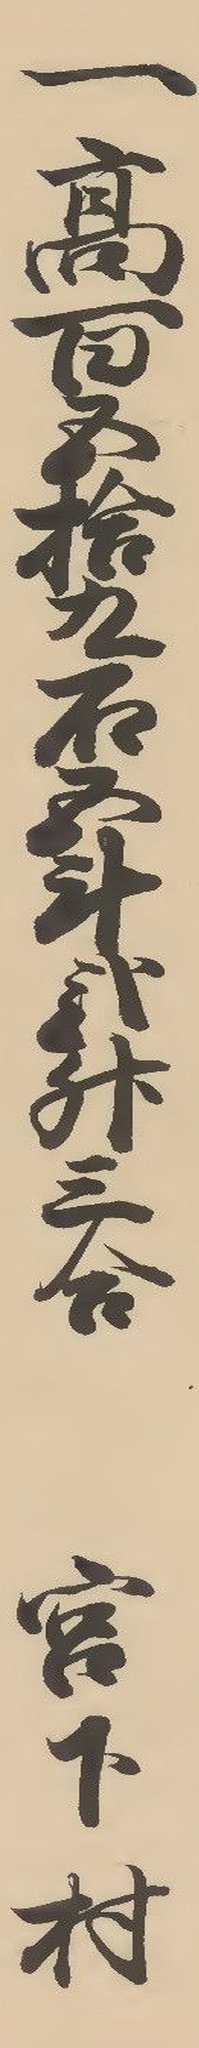一高百五拾九石五斗弐升三合宮下村
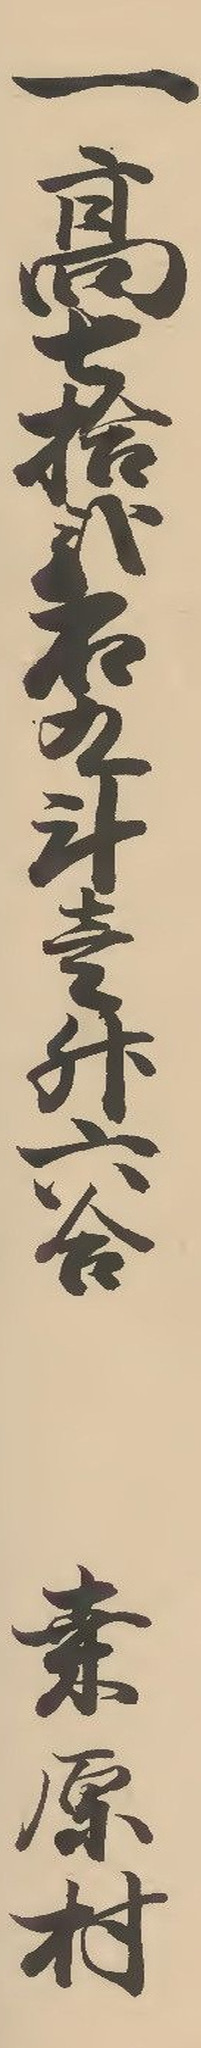一高七拾弐石九斗壱升六合桑原村
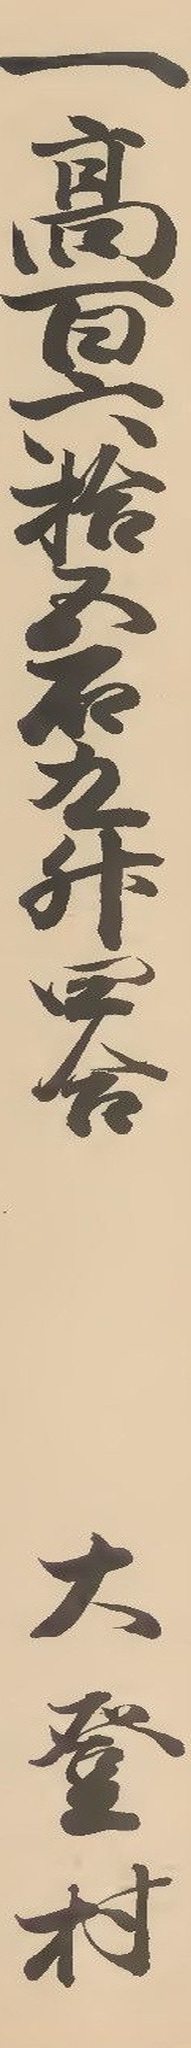一高百六拾五石九升四合大登村
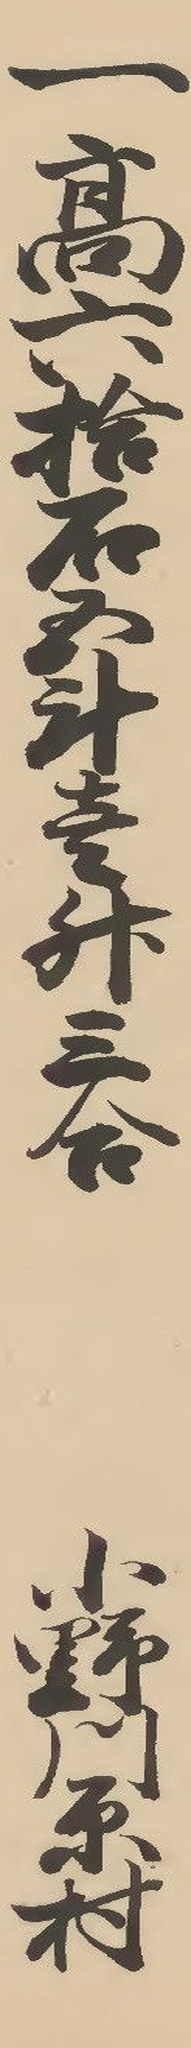一高六拾石五斗壱升三合小野川原村
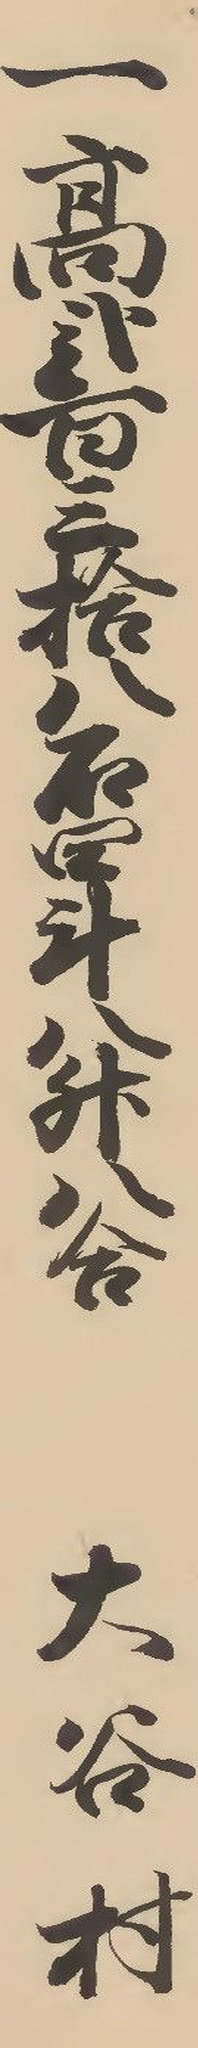一高弐百三拾八石四斗八升八合大谷村
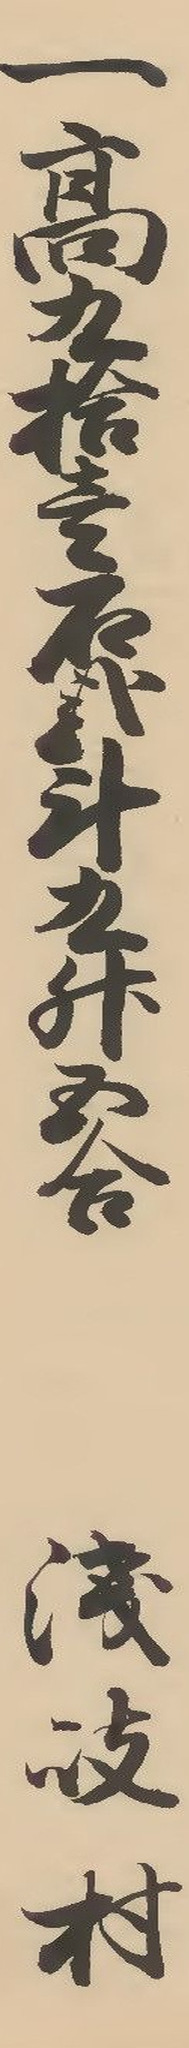一高九拾壱石弐斗九升五合浅岐村

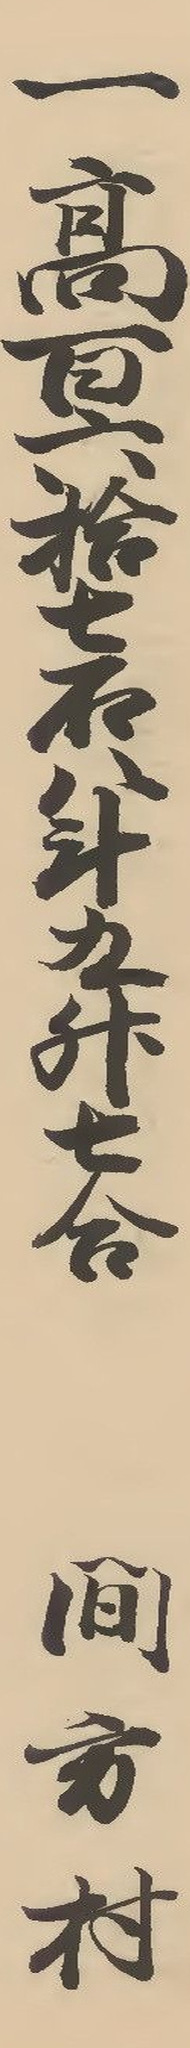一高百六拾七石八斗九升七合間方村
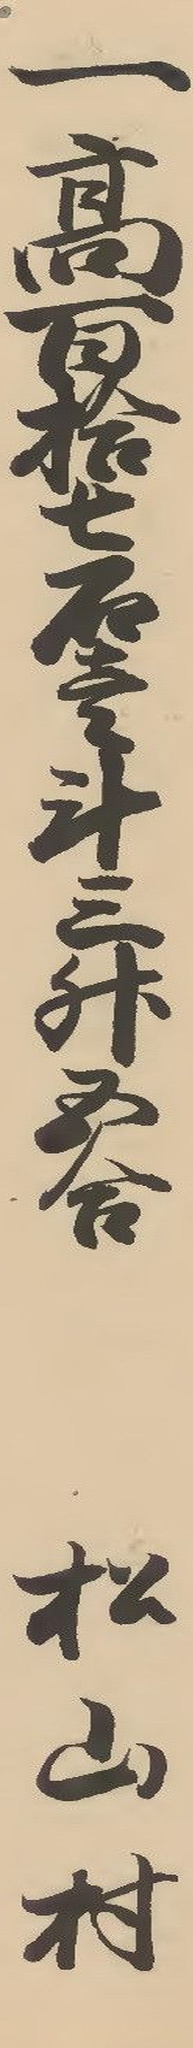一高百拾七石壱斗三升五合松山村
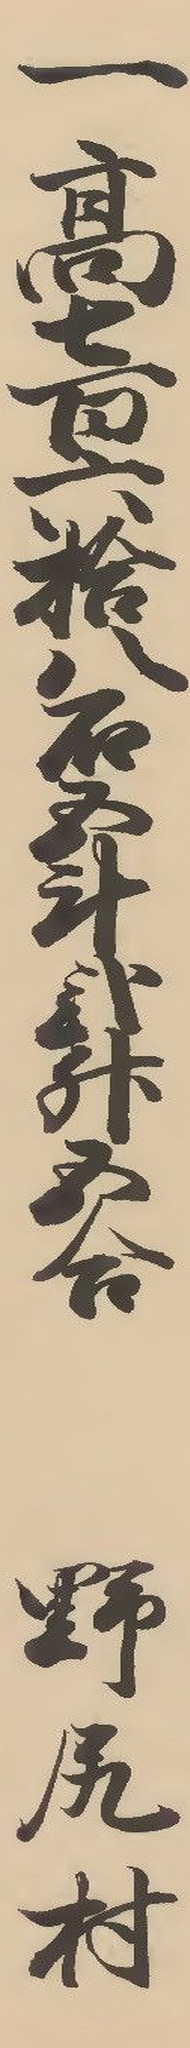一高七百六拾八石五斗弐升五合野尻村
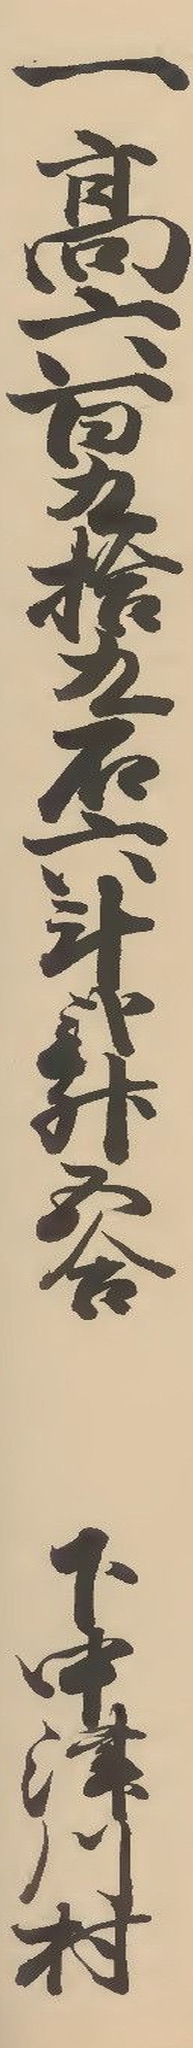一高六百九拾九石六斗弐升五合下中津川村
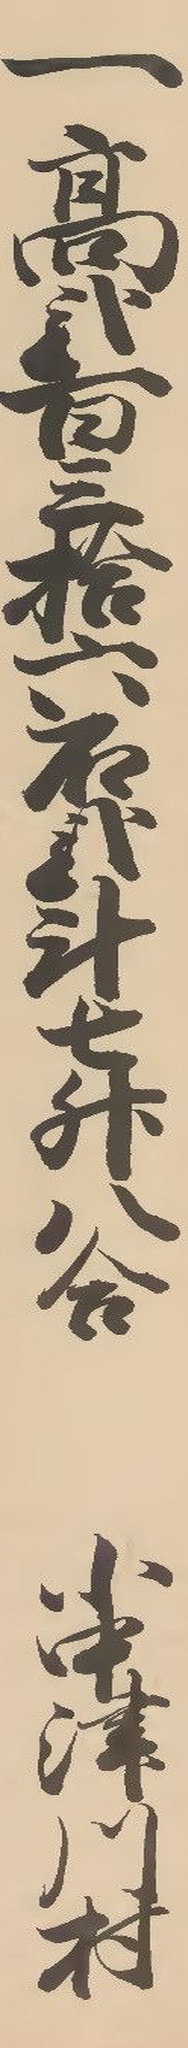一高弐百三拾六石弐斗七升八合小中津川村
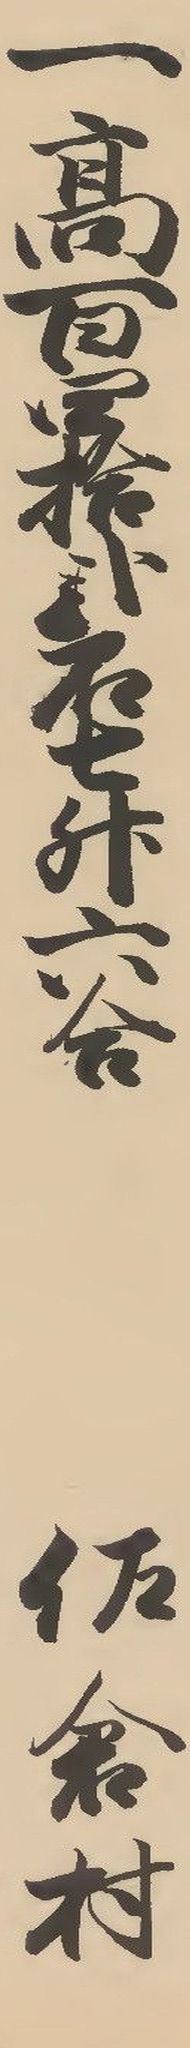一高百四拾弐石七升六合佐倉村
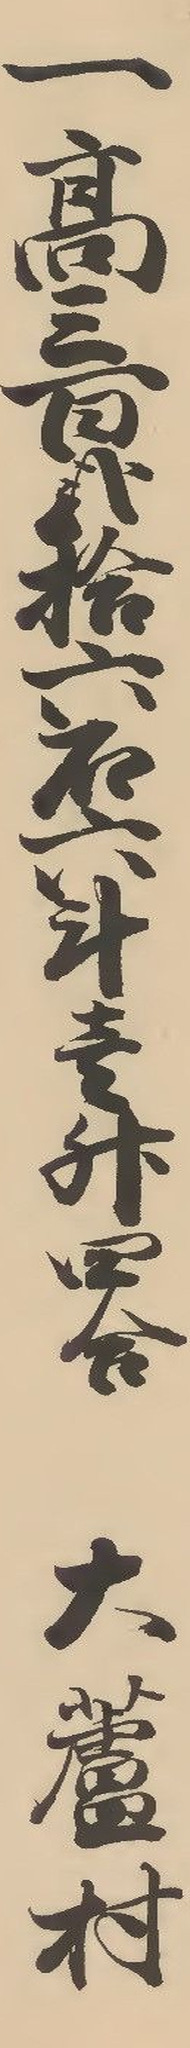一高三百弐拾六石六斗壱升四合大蘆村
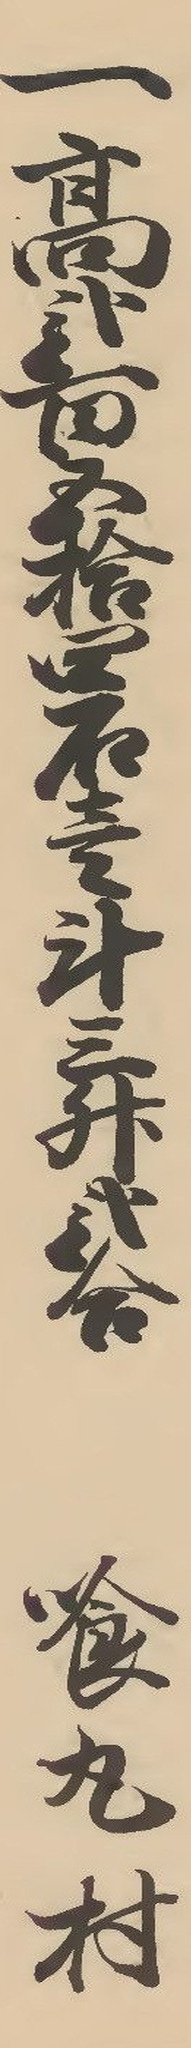一高弐百五拾四石壱斗三升弐合喰丸村
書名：陸奥国郷帳　１
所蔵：国立公文書館 National Archives of Japan
